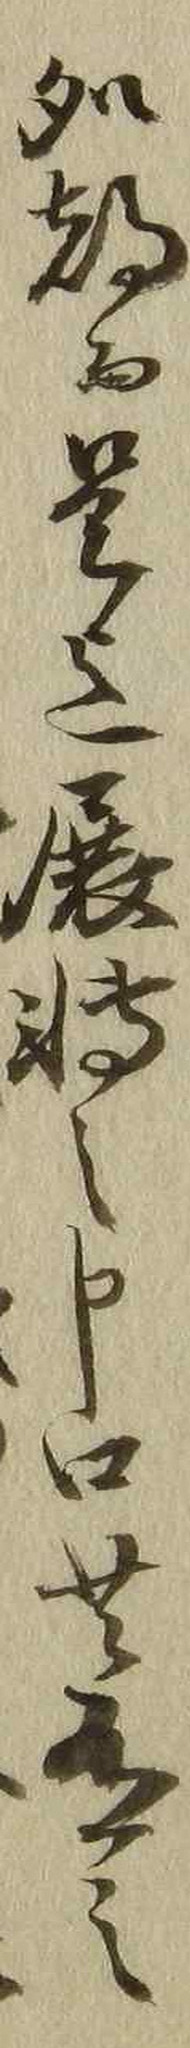処都而是迄展転之之申口共有之
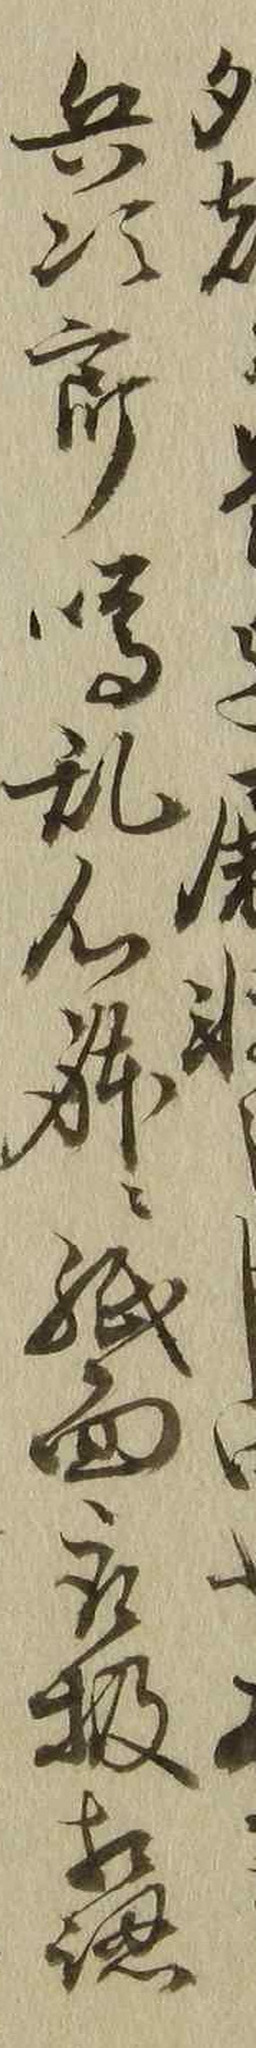兵次郎鳴乱心躰ニ紙面取扱相認
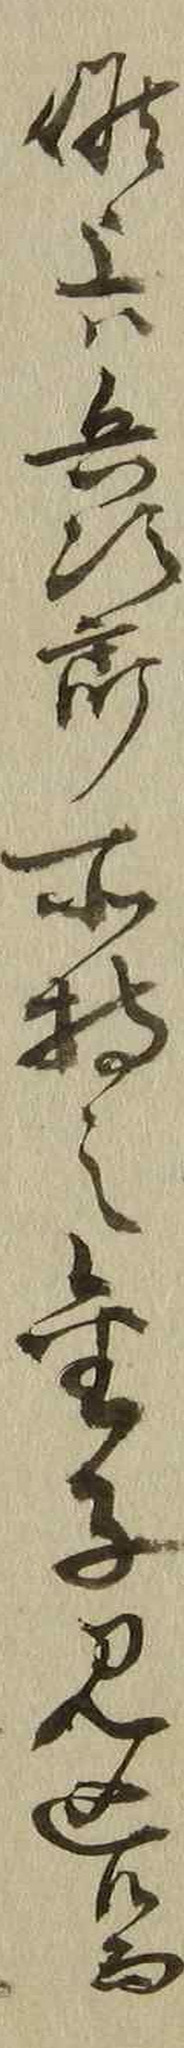候上ハ兵次郎所持之金子見込候而
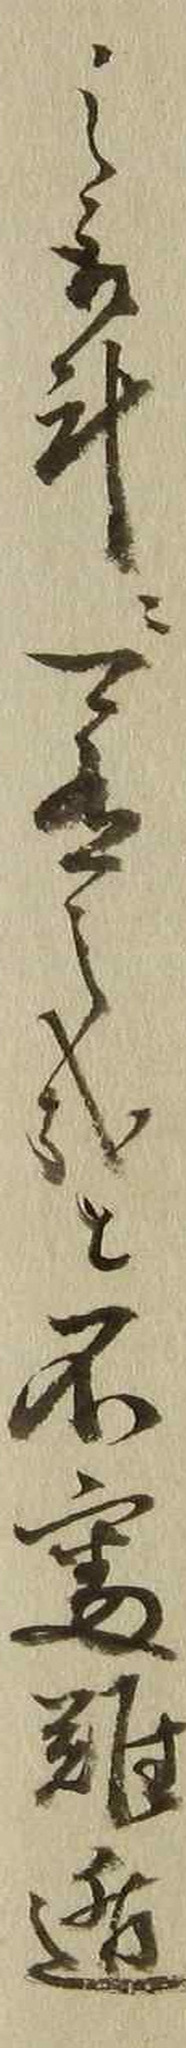之取斗ニ可有之哉と不審難遁
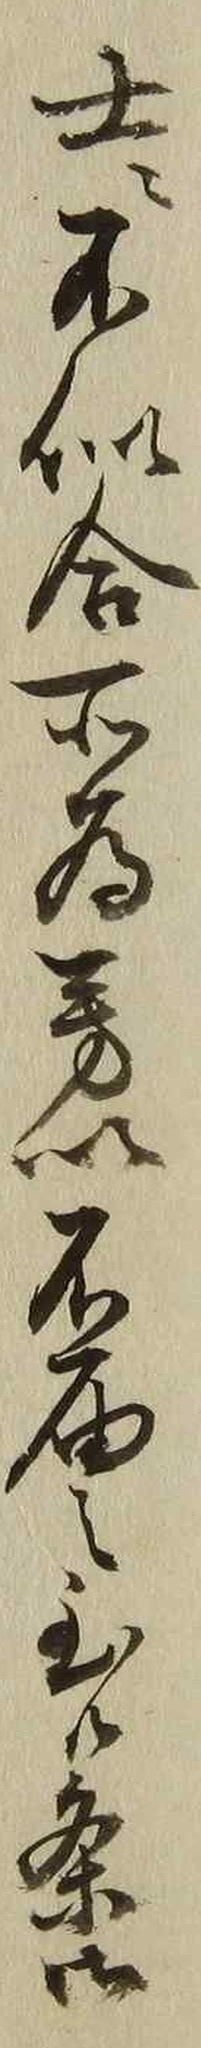士ニ不似合所為芳以不届之至候条御
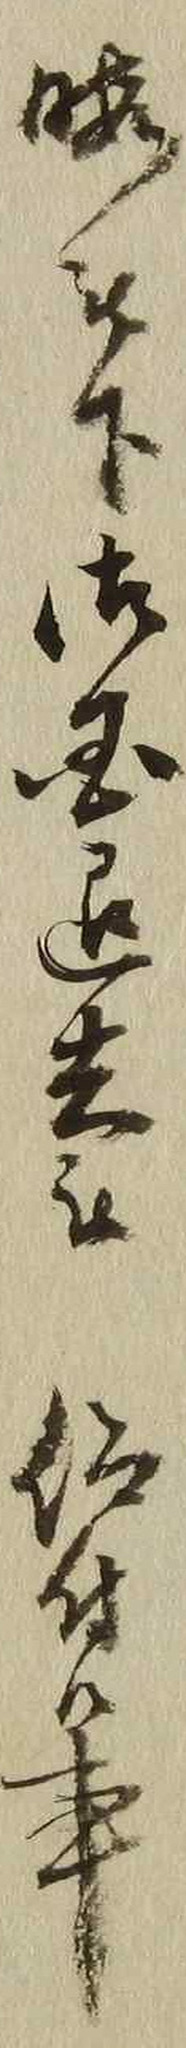暇被下御国退去被仰付候事
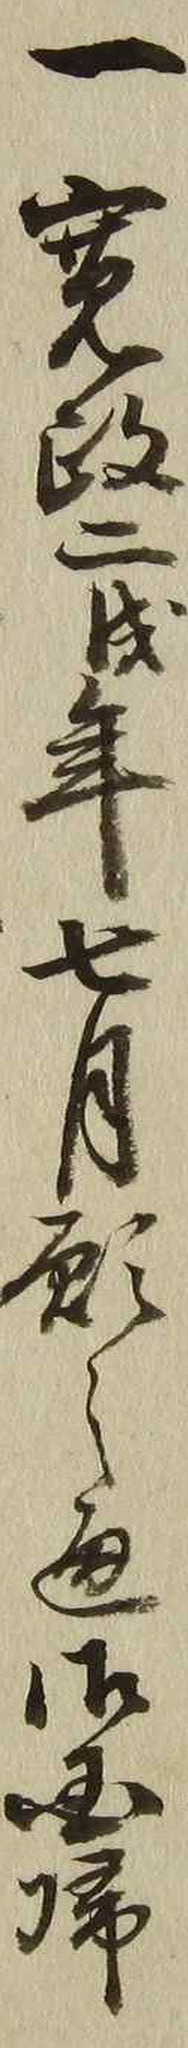一寛政二戌年七月願之通御国帰
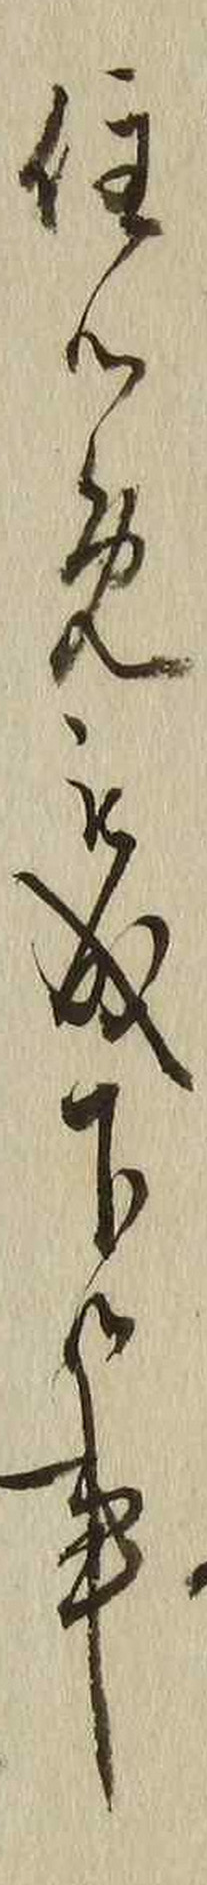住御免被成下候事
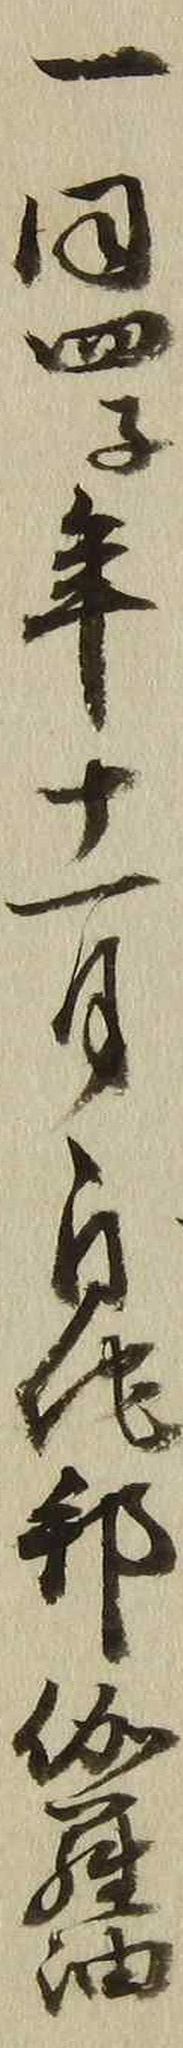一同四子年十一月自作邦伽羅油
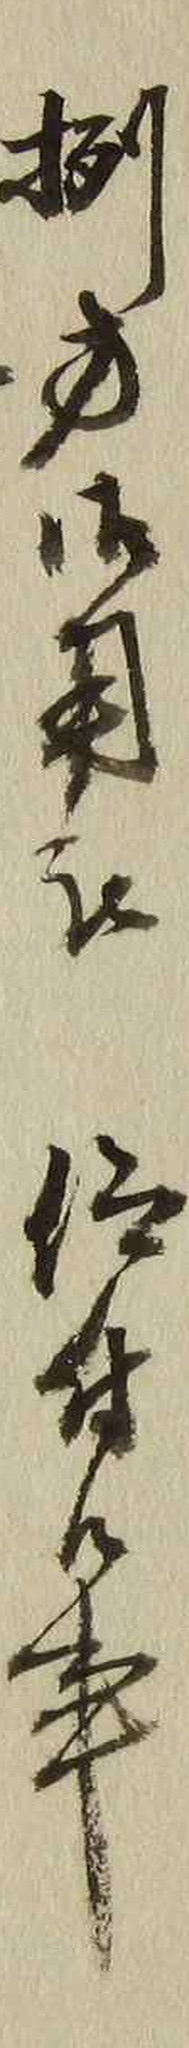捌方御用被仰付候事
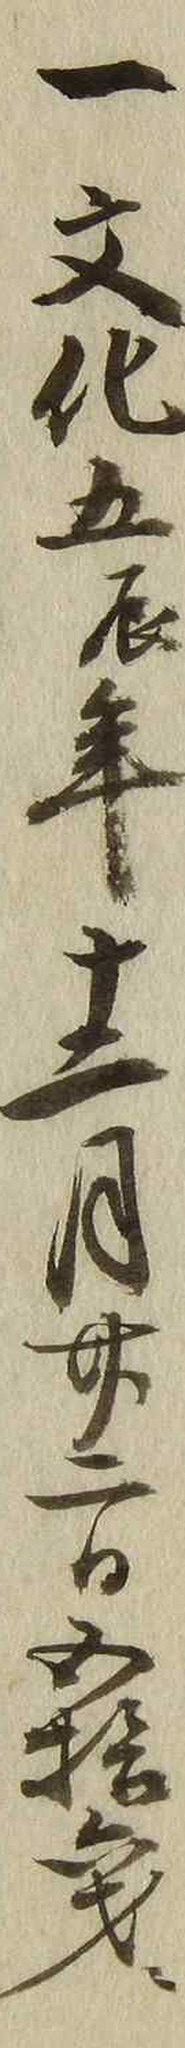一文化五辰年十二月廿二日五拾歳ニ
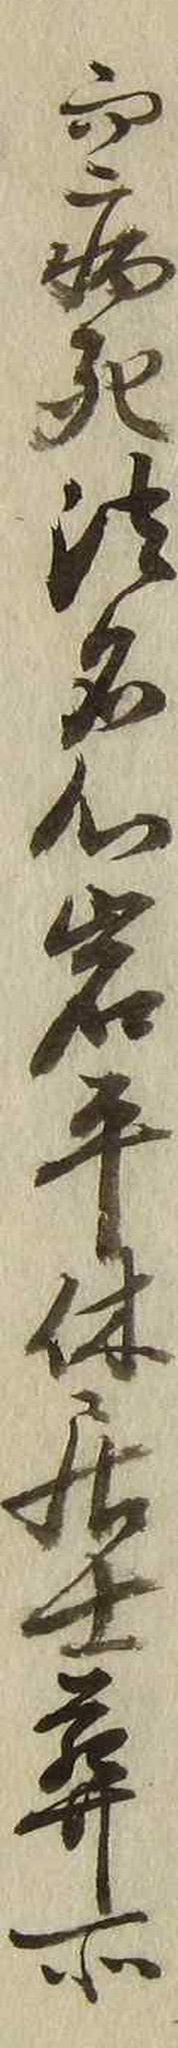而病死法名心岩平休居士葬所

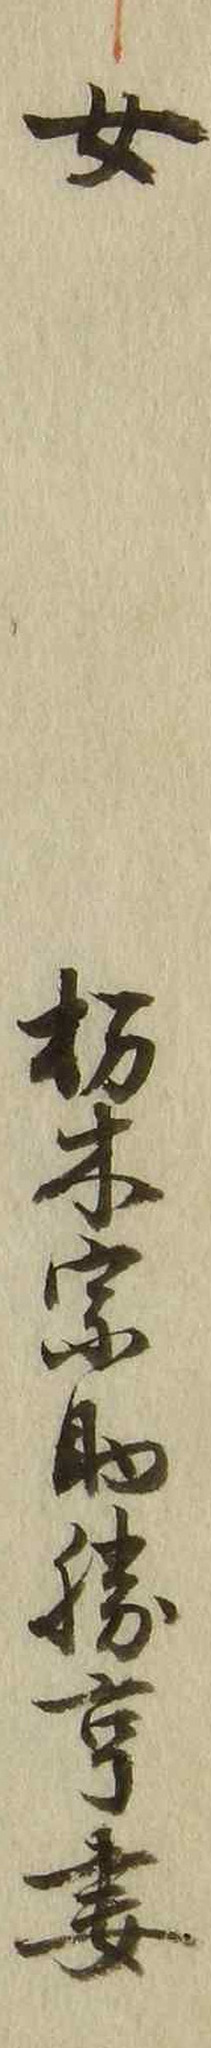女栃木宗助勝亨妻
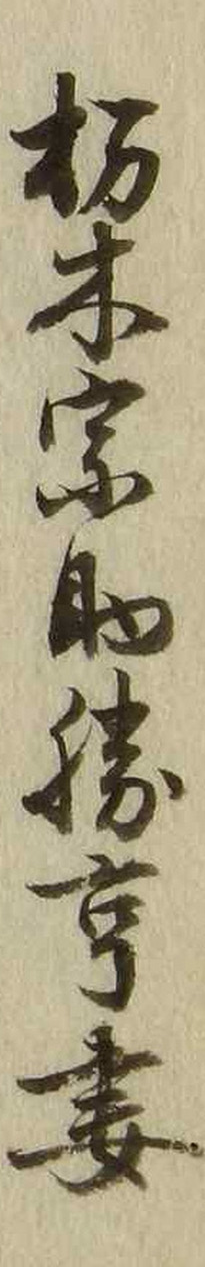女栃木宗助勝亨妻
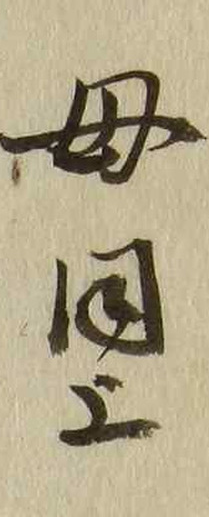母同上
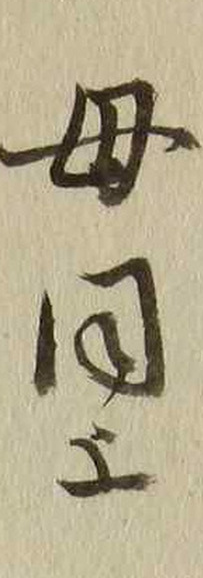母同上
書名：諸士系譜　巻之64　と之部7
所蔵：会津若松市立会津図書館
